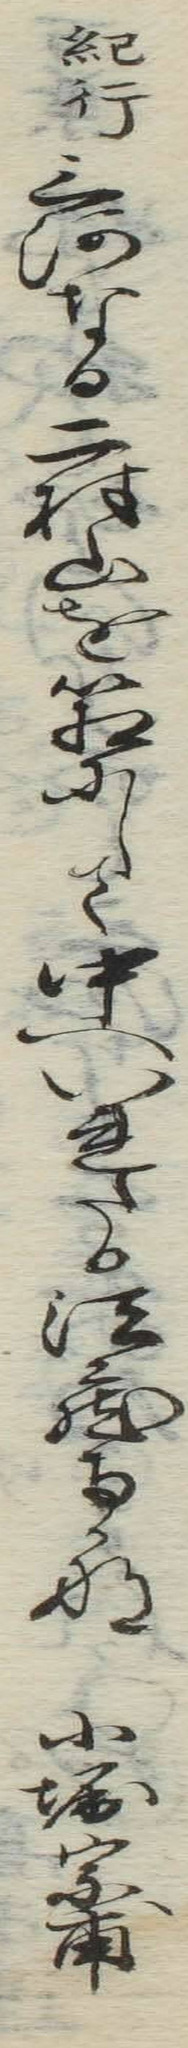紀行三河なる二村山を箱にして中へいれたる法蔵寺かな小堀宗甫
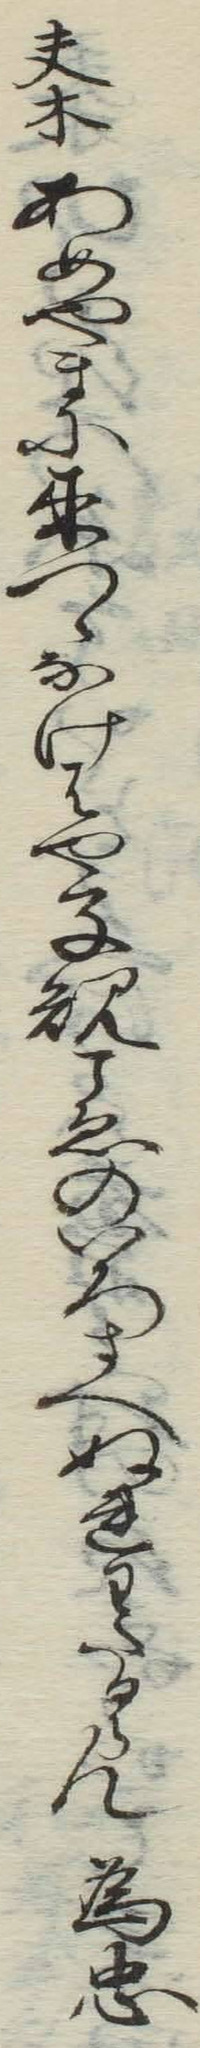夫木あめやまに来つゝなけはや子規こゑのいろさへぬれわたるらん為忠
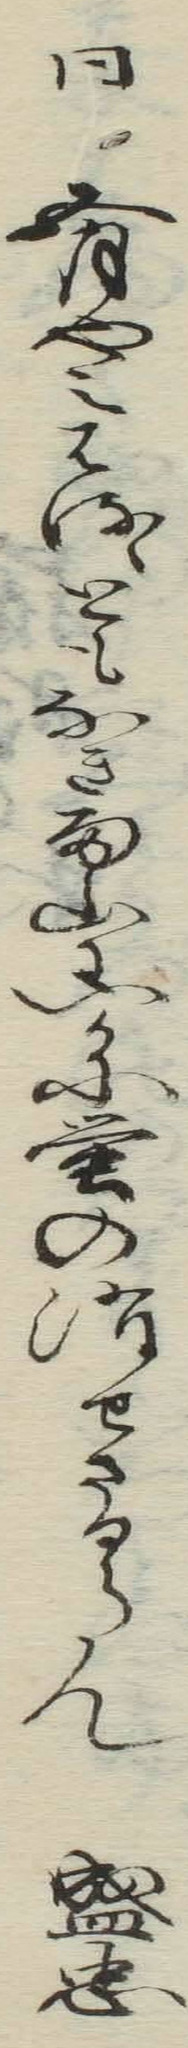同五月やみはるゝともなき雨山にいかに蛍の消せさるらん盛忠
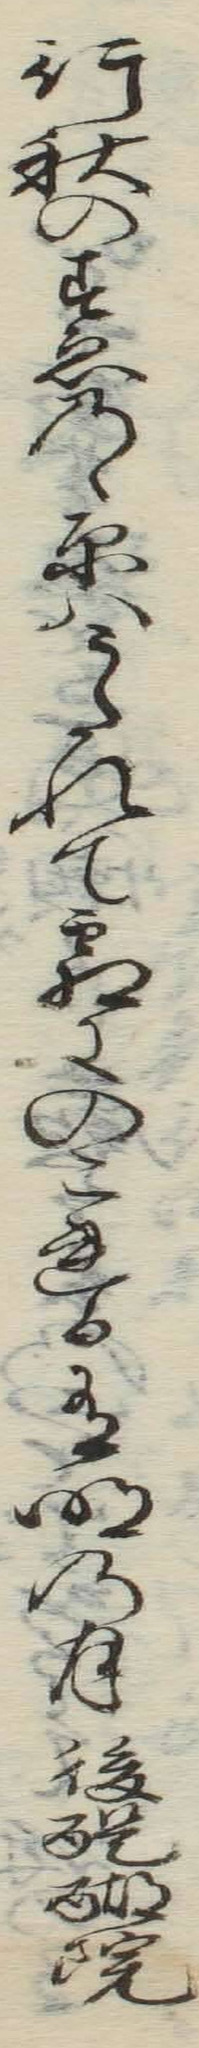新拾行秋のすゑのゝ原はうたれて霜にのこれる有明の月後醍醐院
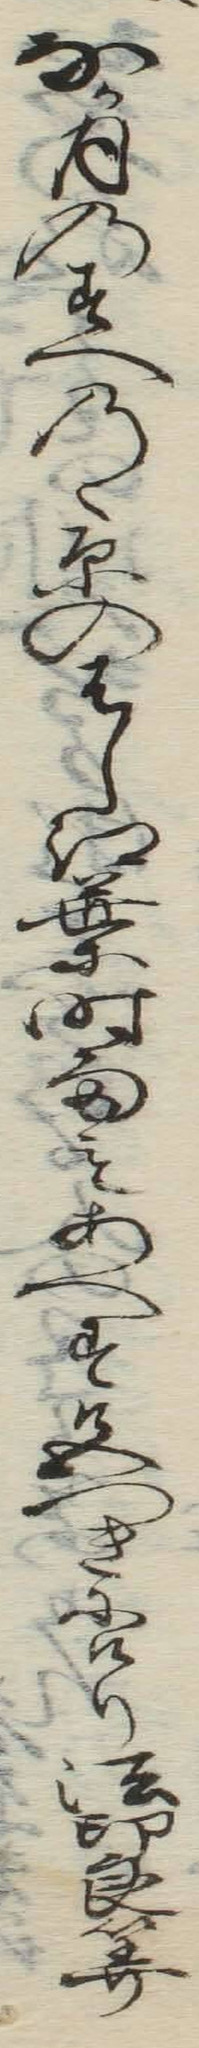続後拾なか月のすへのゝ原のはし紅葉時雨もあへす色つきにけり法印良算
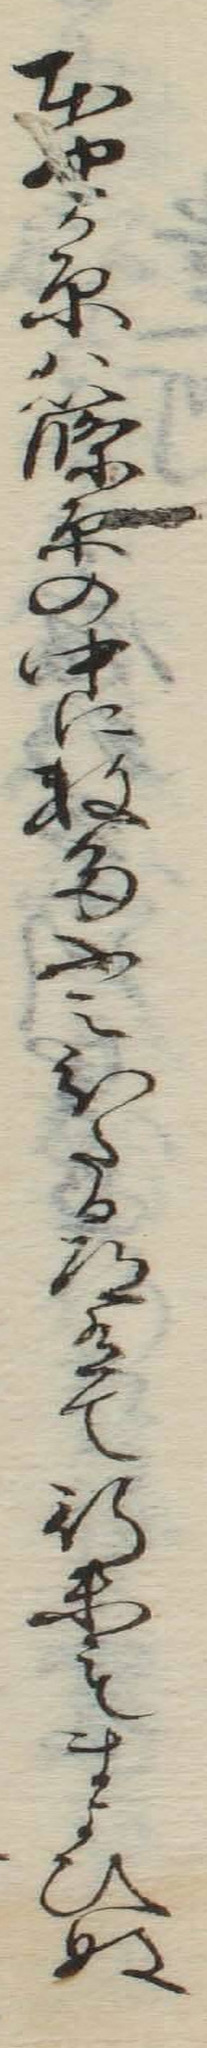本野か原は篠原の中に数多ふみ分たる道有て行来もまよひぬ
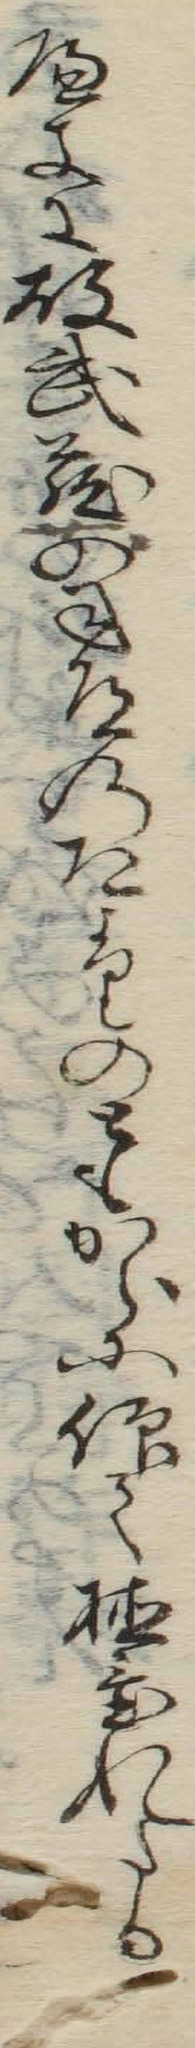へきに故武蔵の司道のたよりのともからに仰て植置れたる

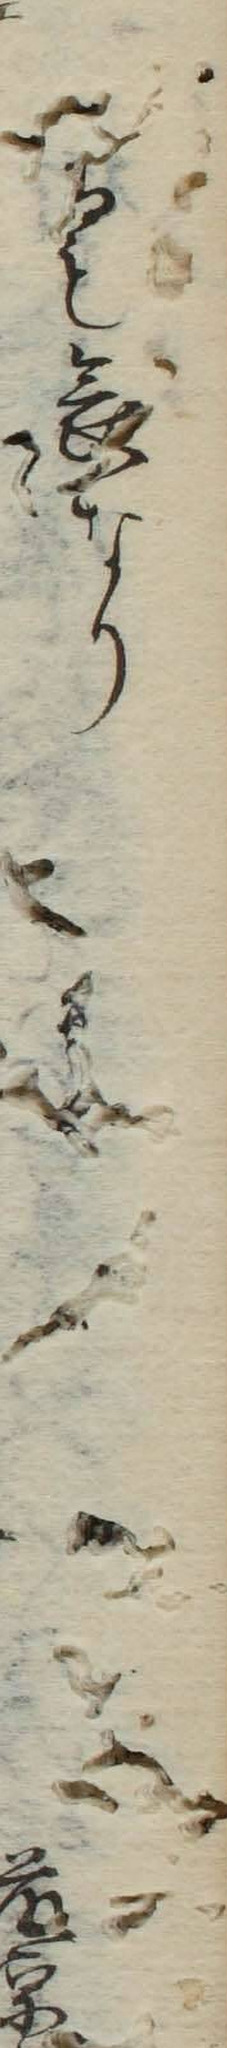るも哀なり
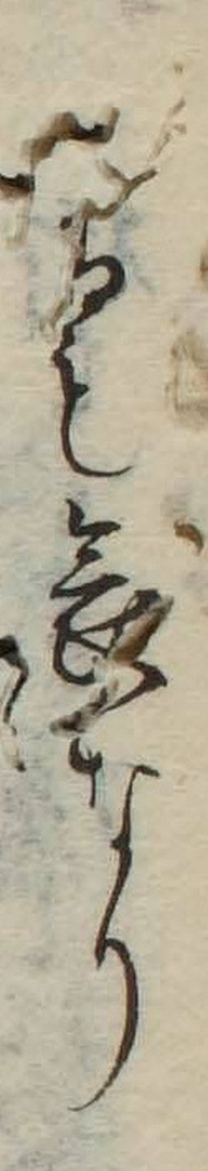るも哀なり
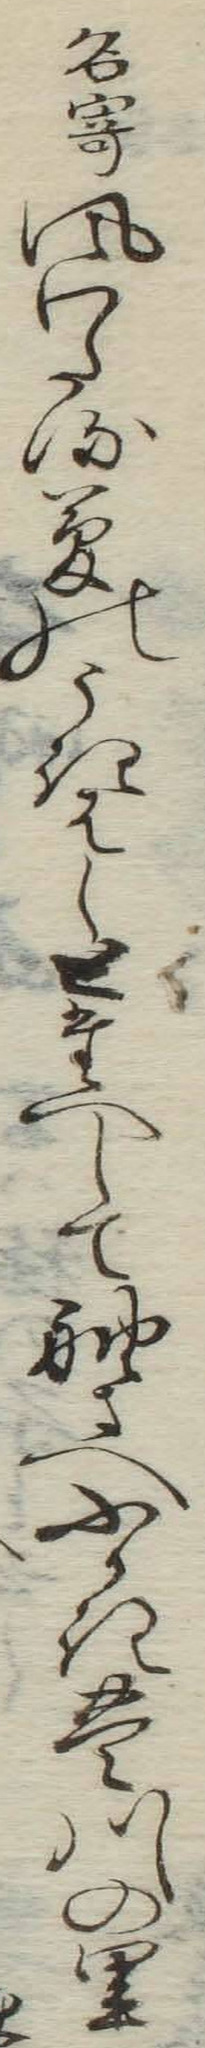名寄風わたる夢のうきはしとたへして袖さへふかき豊川の里
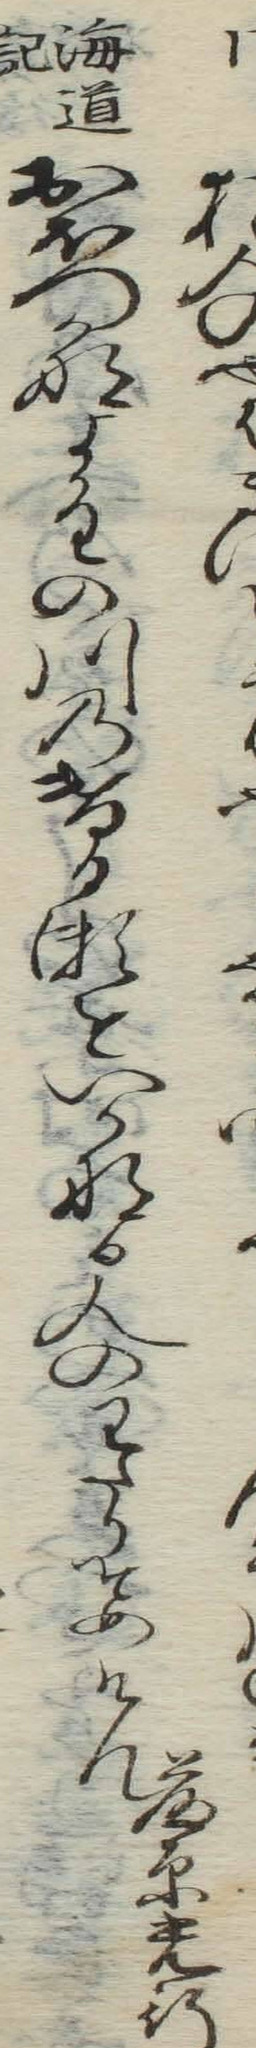海道記おほつかなよかわの川のける瀬をいかなる人のわたりそめけん藤原光行
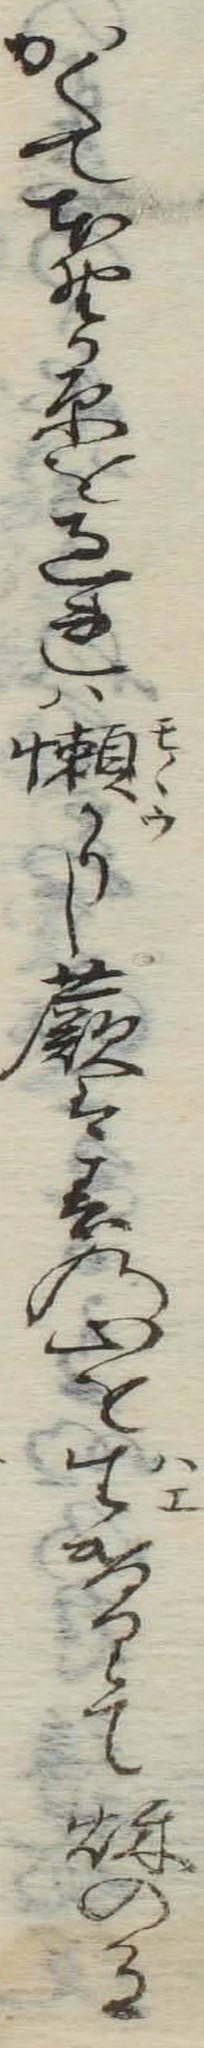かくて本野か原を過れは懶かりし蕨は春の心を生たりて秋の色
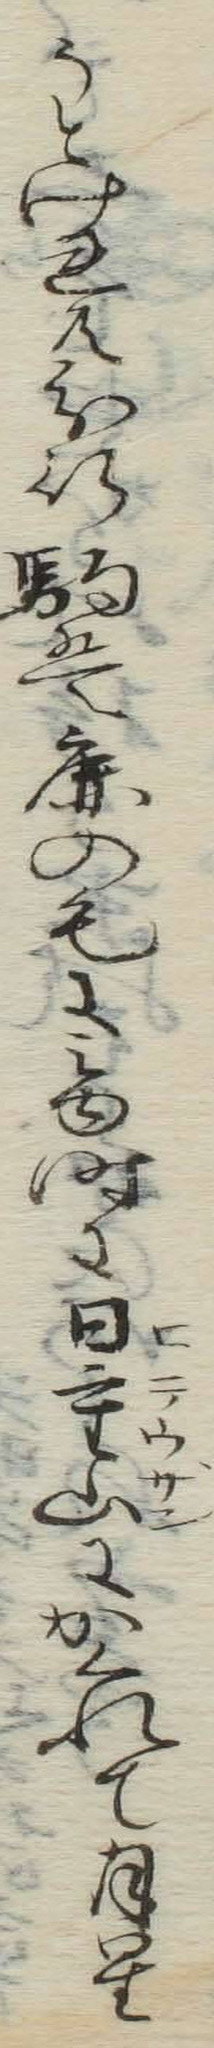うとけれ共分行駒は鹿の毛にみゆ時に日重山にかくれて月星
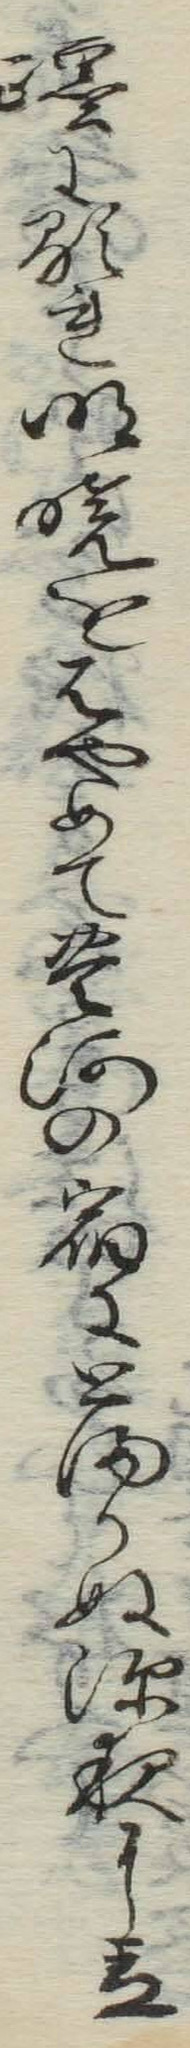に顕れ明暁をはやめて豊河の宿にとまりぬ深夜に立
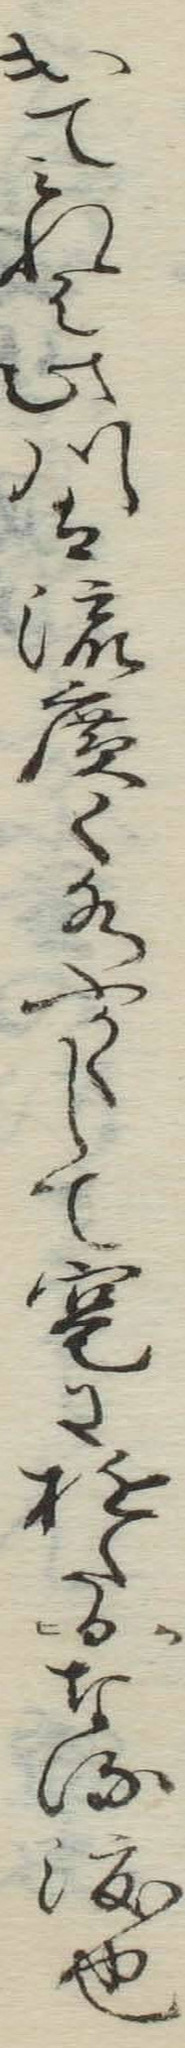出てみれは此川は流広く水ふかくして寔に遊たるなる渡也
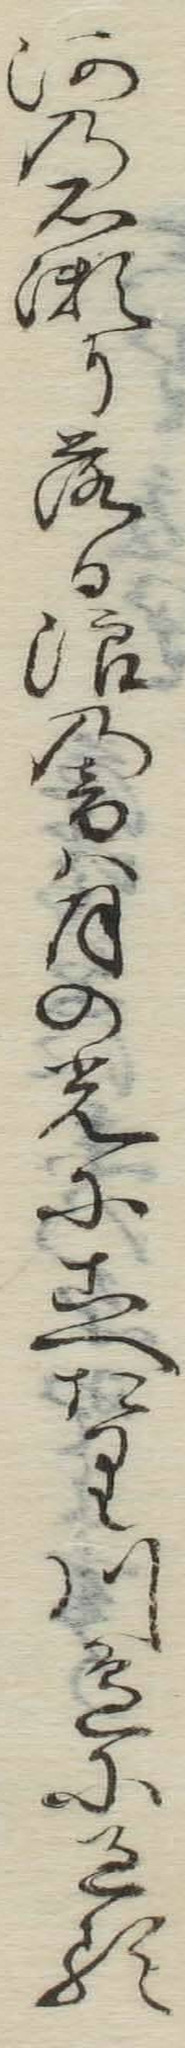河の石瀬に落る浪の音は月の光にこへたるも川辺に過る
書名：三河国二葉松
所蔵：国文学研究資料館
